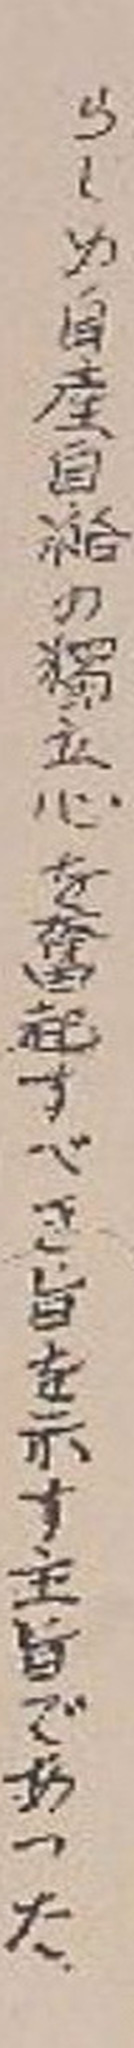らしめ自産自給の独立心を奮起すべき旨を示す主旨であつた
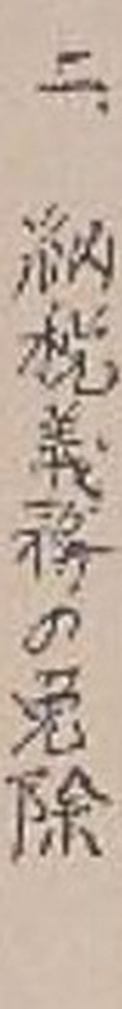ニ．納税義務の免除
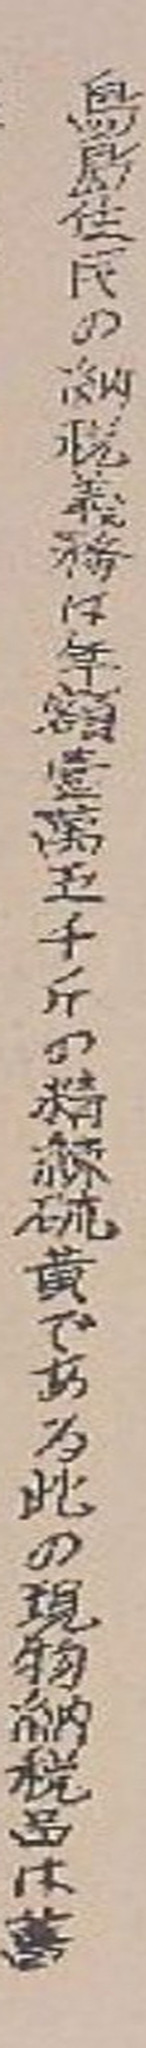鳥島住民の納税義務は年額壱万五千斤の精練硫黄である此の現物納税品は旧
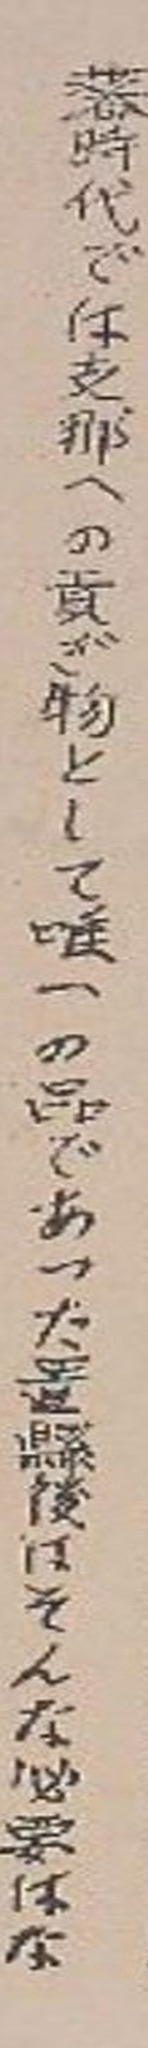藩時代では支那への貢ぎ物として唯一の品であつた置県後はそんな必要はな
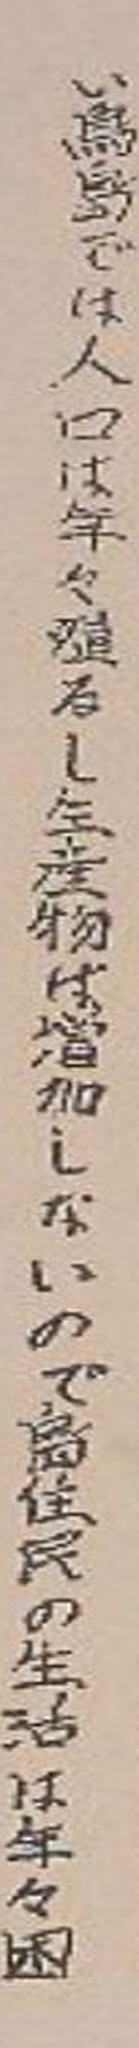い鳥島では人口は年々殖るし生産物は増加しないので島住民の生活は年々困

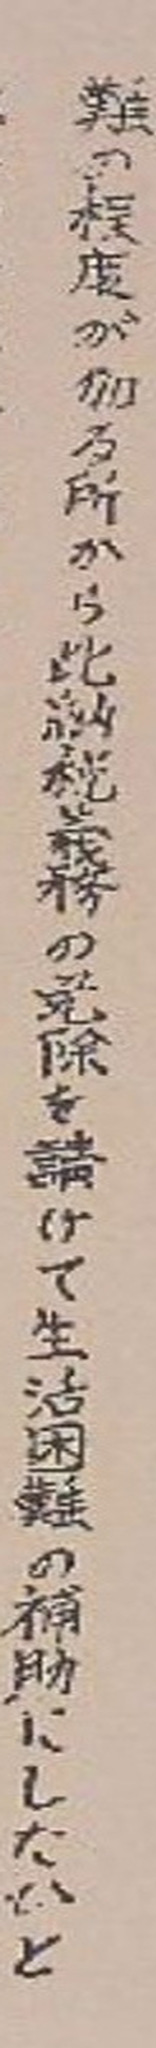難の程度が加る所から此納税義務の免除を請けて生活困難の補助にしたひと
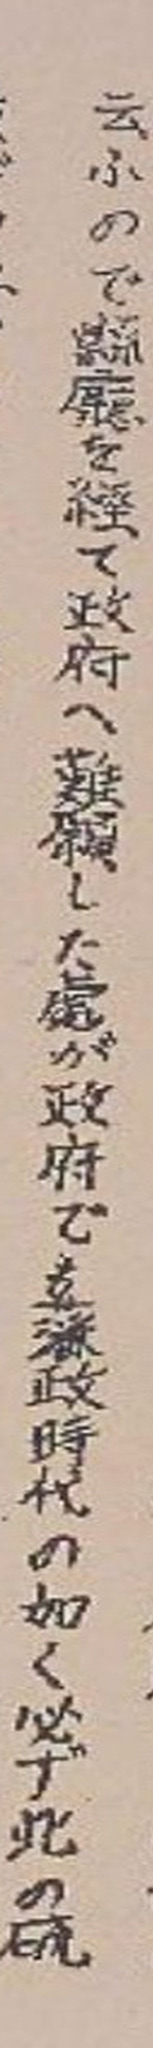云ふので県庁を経て政府へ難願した処が政府でも藩政時代の如く必ず此の硫
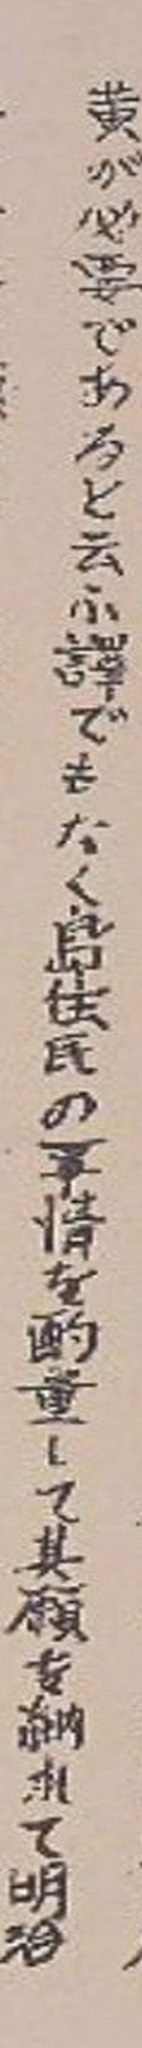黄が必要であると云ふ訳でもなく島住民の事情を酌量して其願を納れて明治
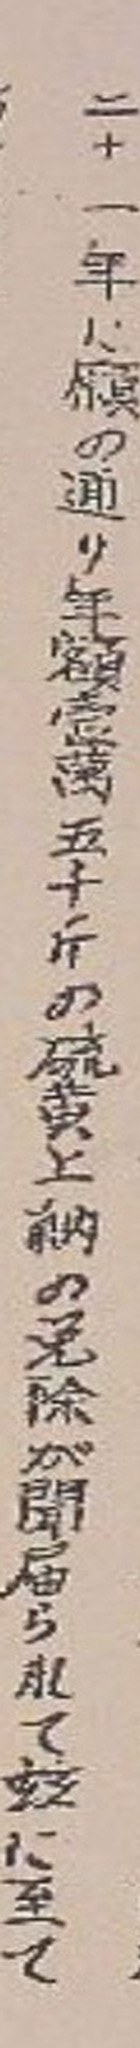二十一年に願の通り年額壱万五千斤の硫黄上納の免除が聞届られて茲に至て
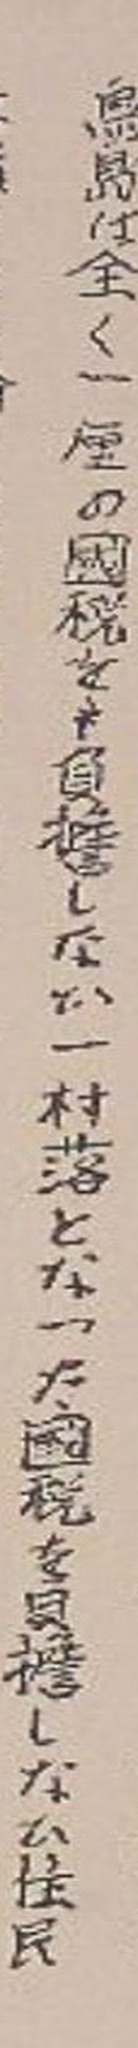鳥島は全く一厘の国税をも負担しなひ一村落となつた国税を負担しなひ住民
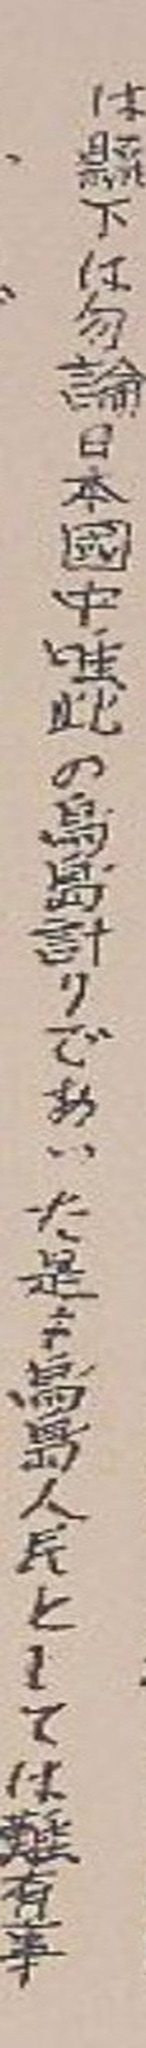は県下は勿論日本国中唯此の鳥島計りであった是も鳥島人民としては難有事
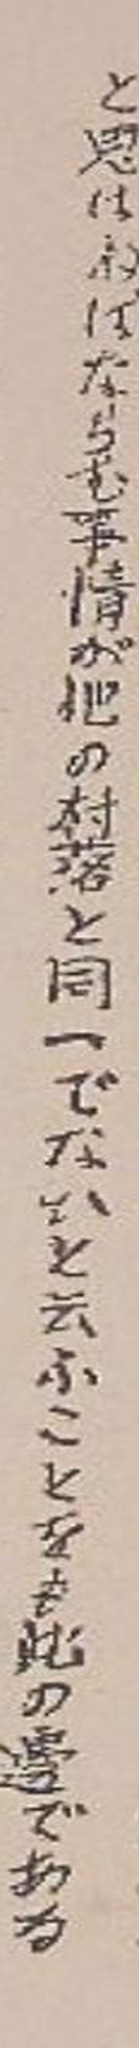と思はねばならむ事情が他の村落と同一でなひと云ふことをも此の辺である
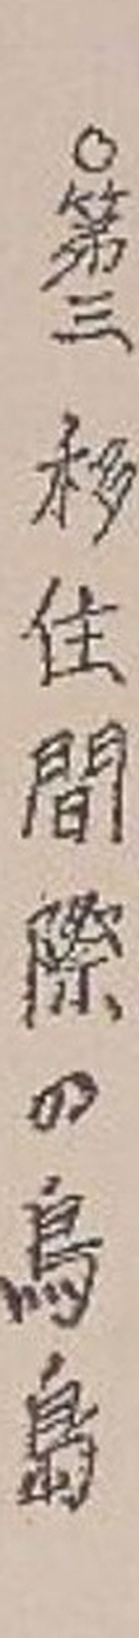○第三移住間際の鳥島
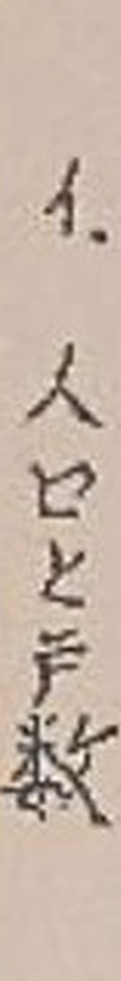イ．人口と戸数
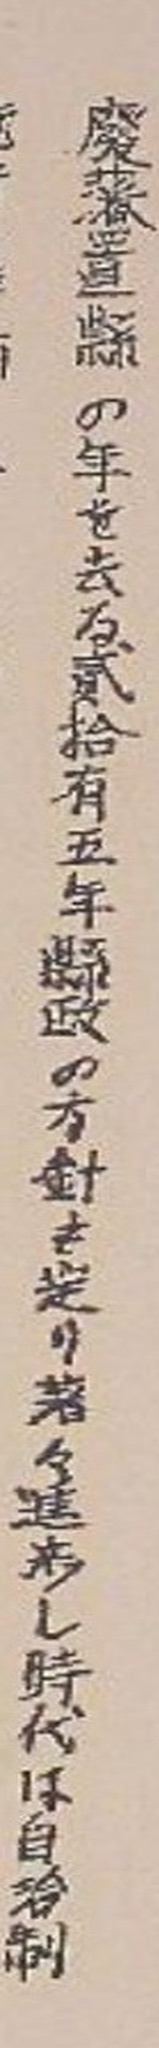廃藩置県の年を去る弐拾有五年県政の方針も定り著々進歩し時代は自治制
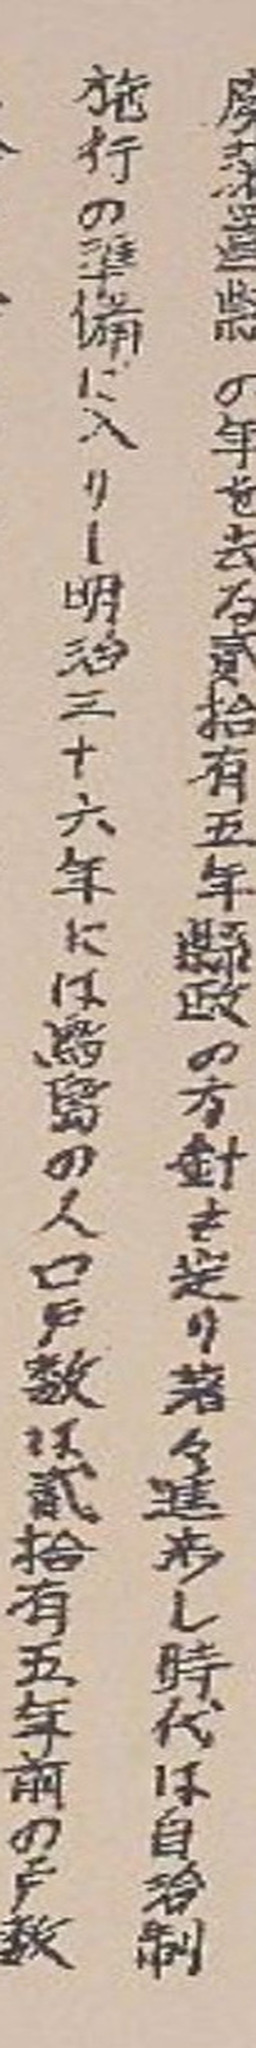施行の準備に入りし明治三十六年には鳥島の人口戸数は弐拾有五年前の戸数
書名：鳥島移住始末
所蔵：University of the Ryukyus Library
